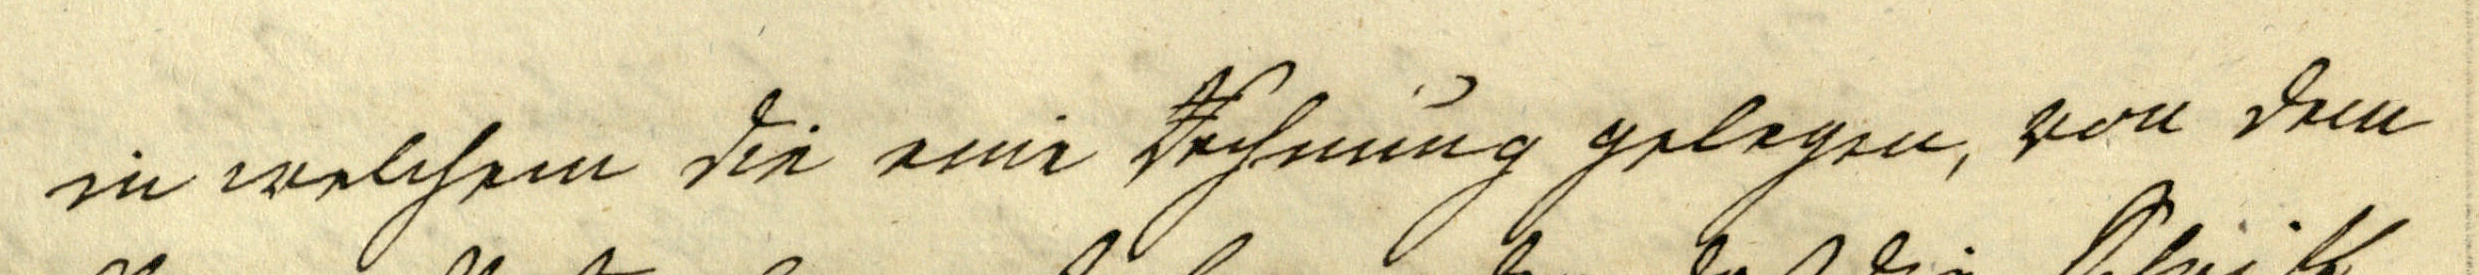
in welchem die eine Rechnung gelegen, von dem
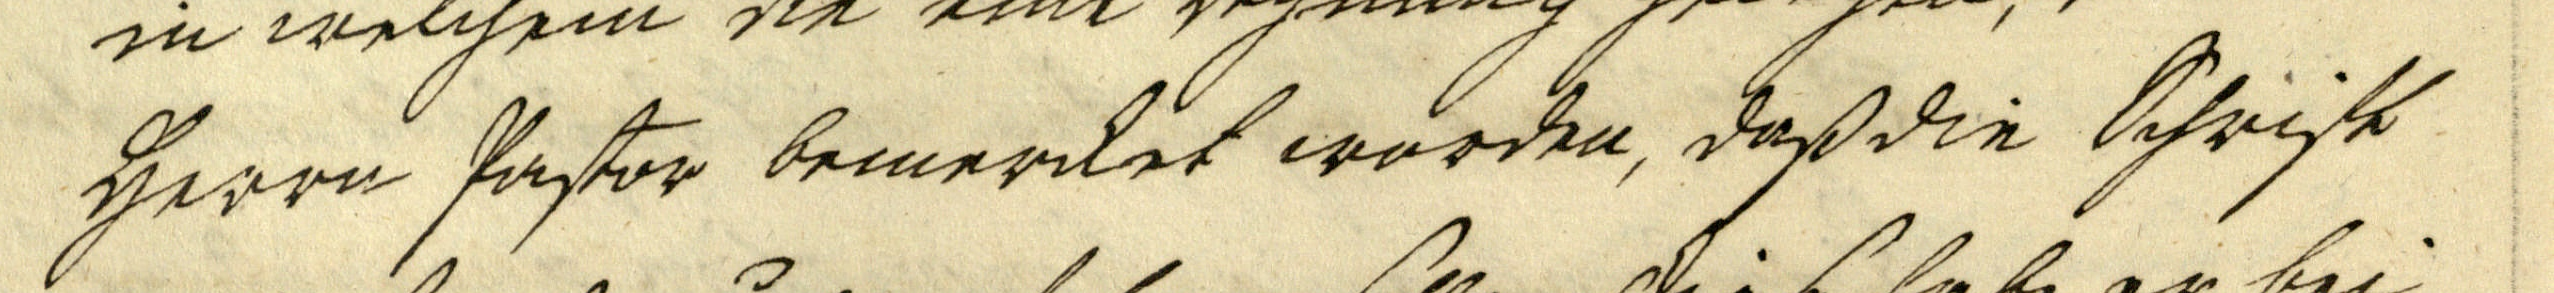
Herrn Pastor bemerket worden, daß die Schrift
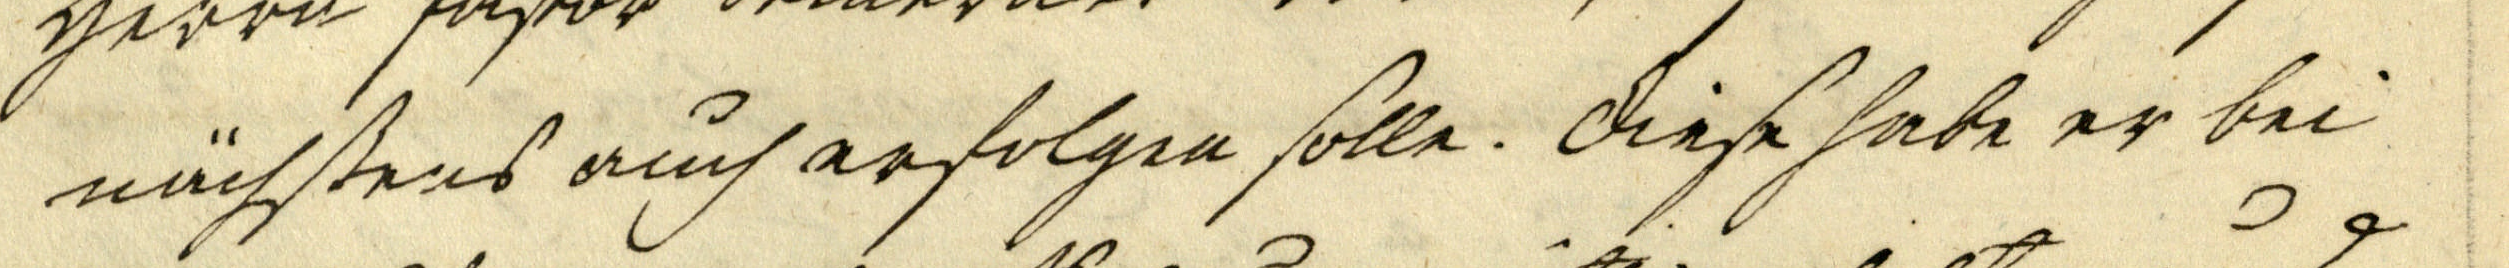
nächstens auch erfolgen solle. Diese habe er bei
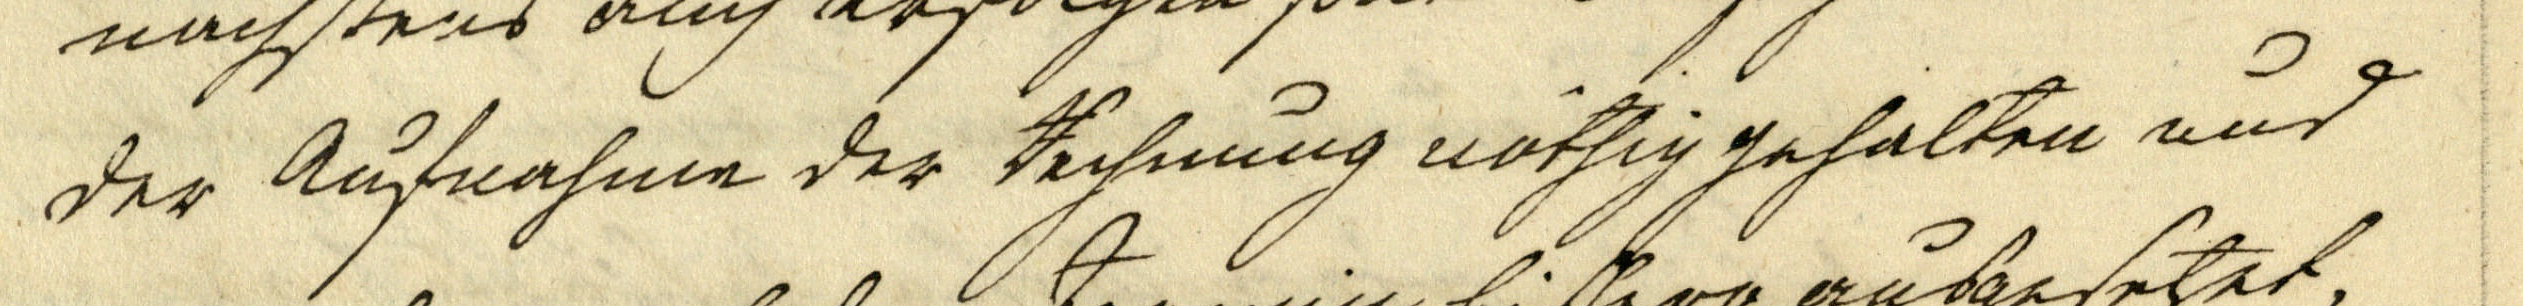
der Aufnahme der Rechnung nöthig gehalten und
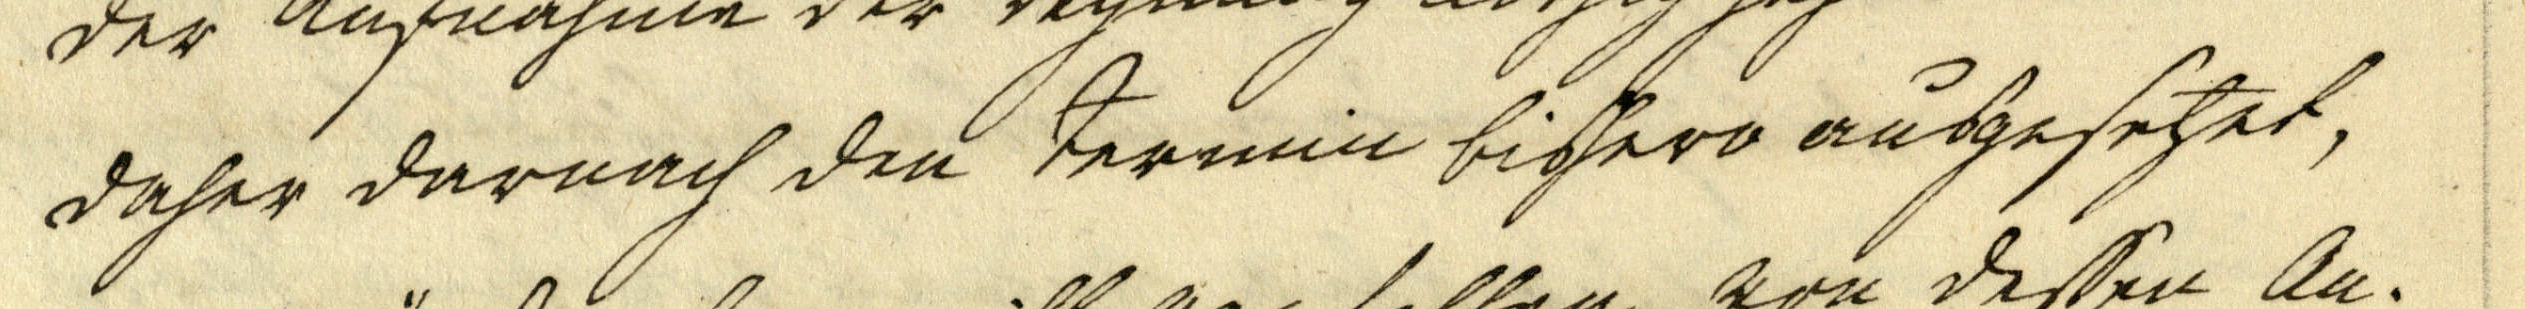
daher darnach den Termin bishero ausgesetzet,
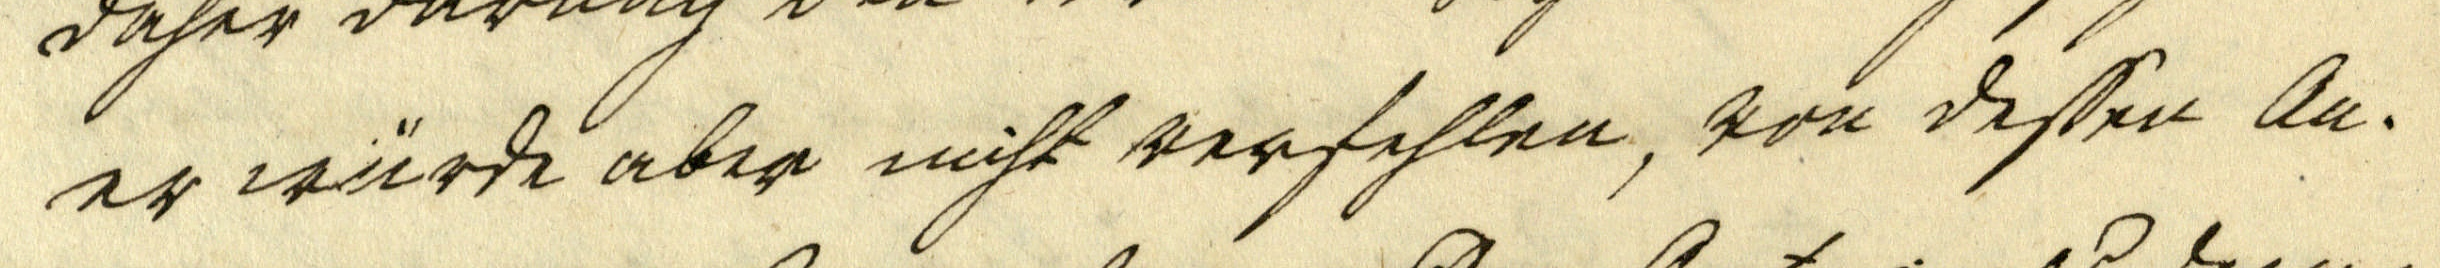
er würde aber nicht verhehlen, von dessen An-
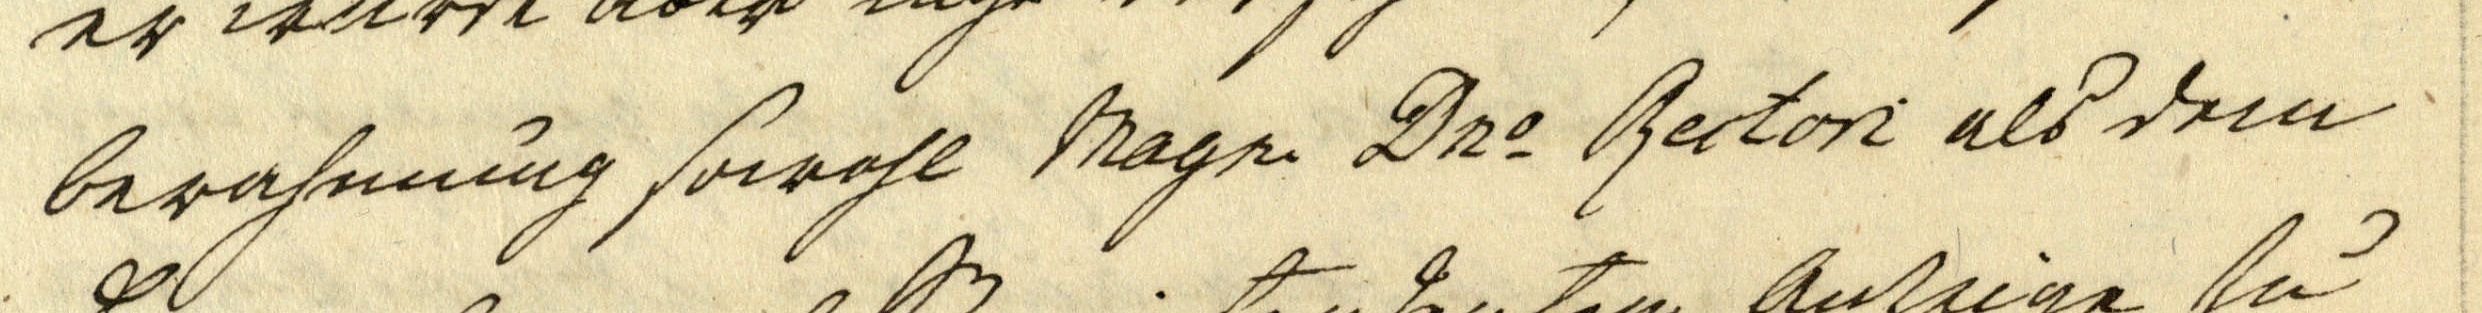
berahmung sowohl Magn. Dn.o Rectori als dem
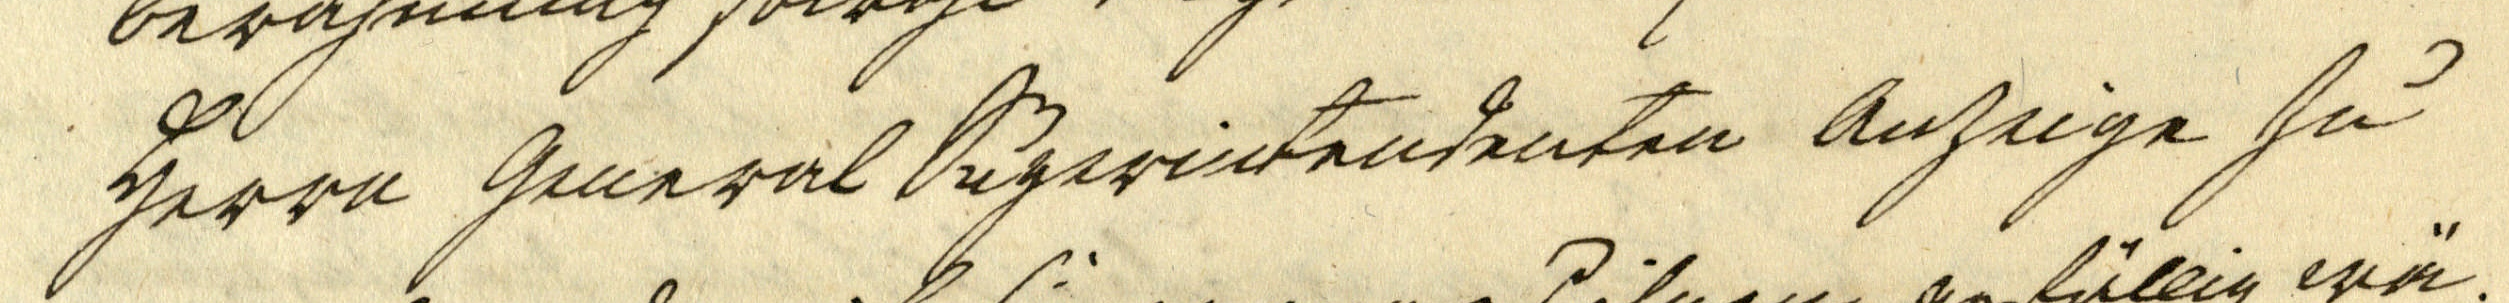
Herrn General Superintendenten Anzeige zu
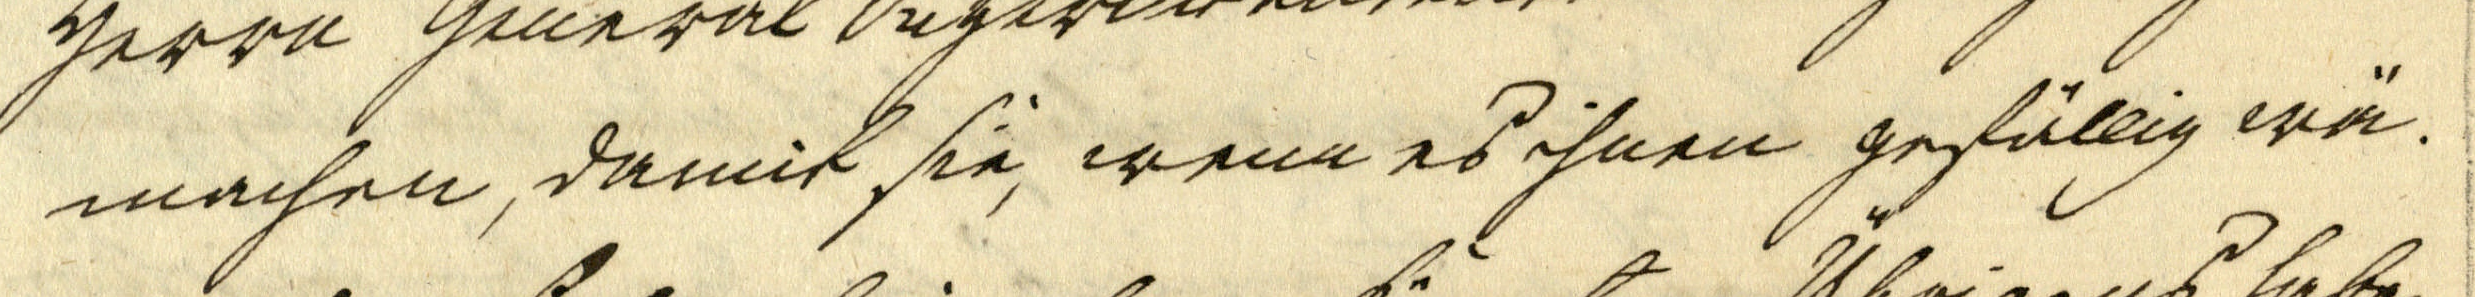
machen, damit sie, wenn es ihnen gefällig wä-
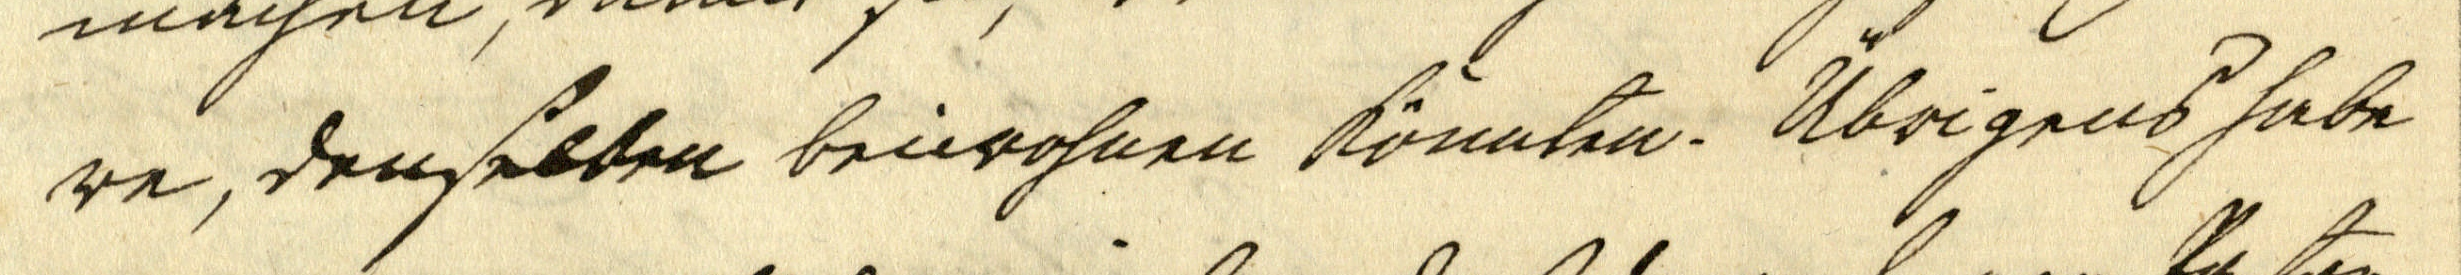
re, denselben beiwohnen könnten. Übrigens habe
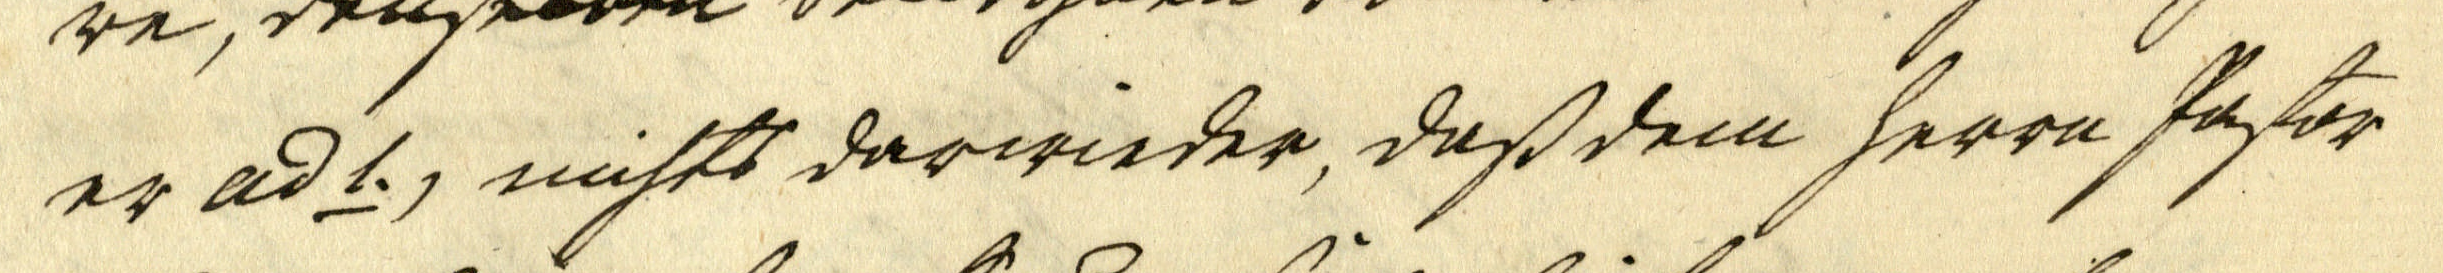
er ad 1., nichts darwieder, daß dem herrn Pastor
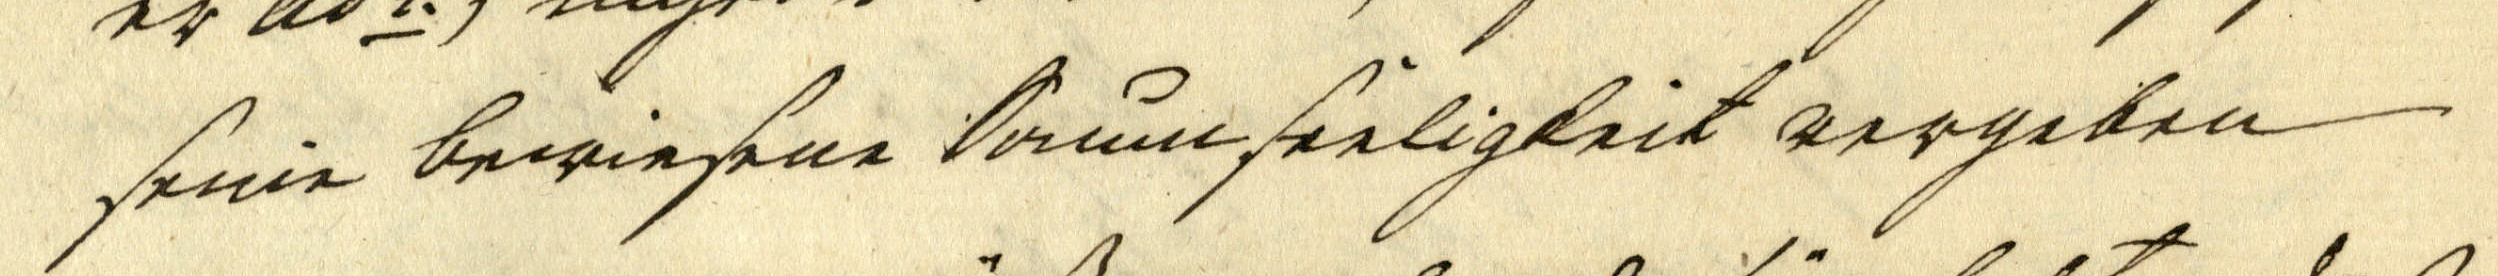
seine bewiesene Saumseeligkeit vergeben
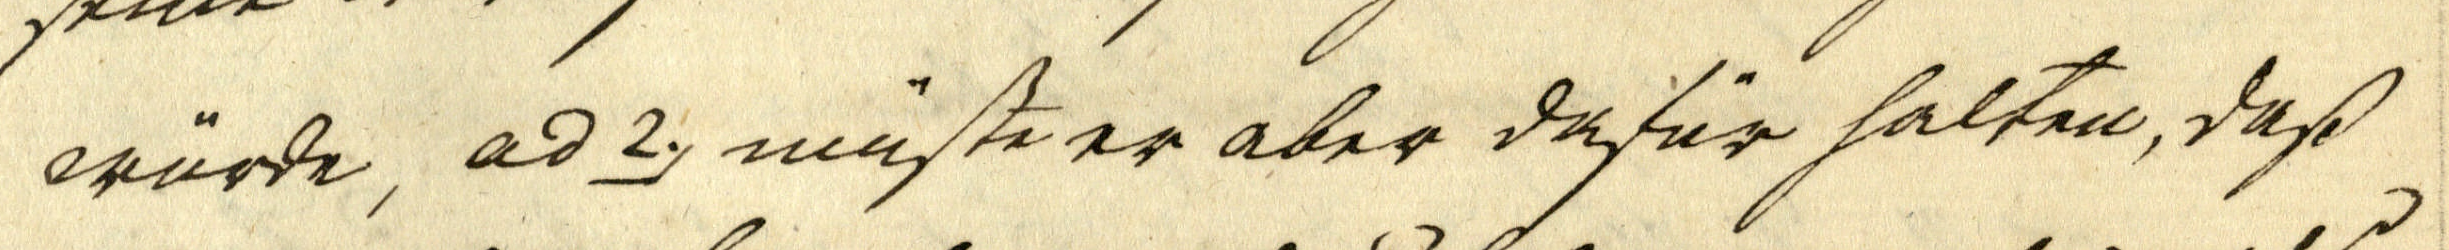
würde, ad 2., müßte er aber dafür halten, daß
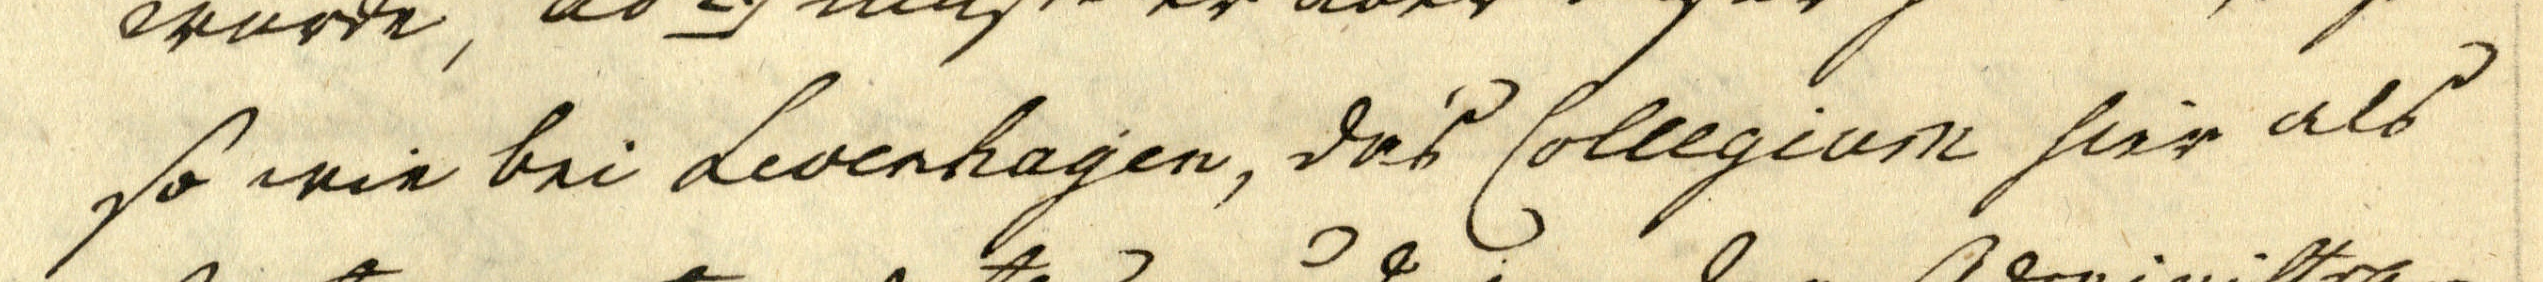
so wie bei Levenhagen, das Collegium hier als
